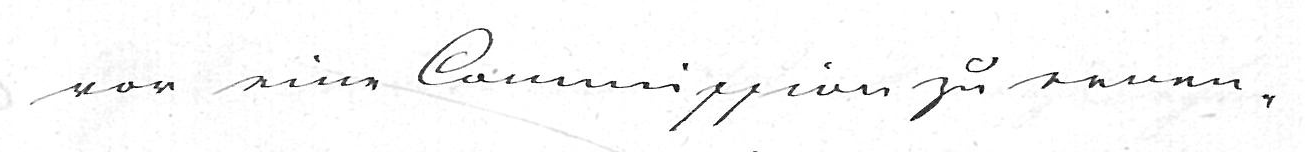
vor eine Commission zu ernen-
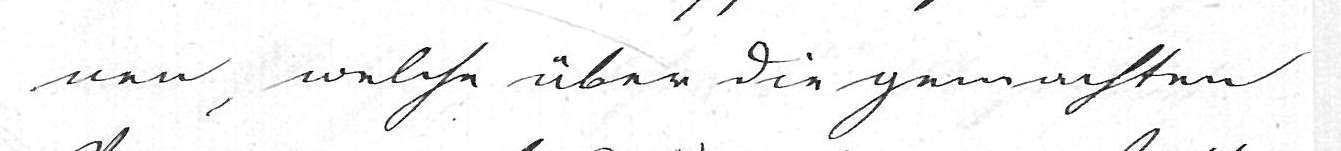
nen, welche über die gemachten
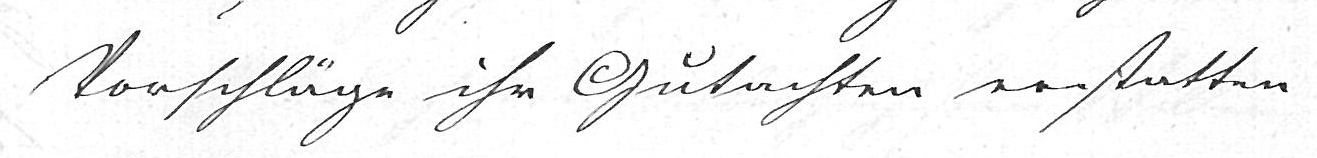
Vorschläge ihr Gutachten erstatten
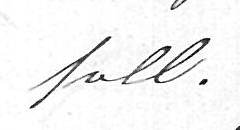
soll.
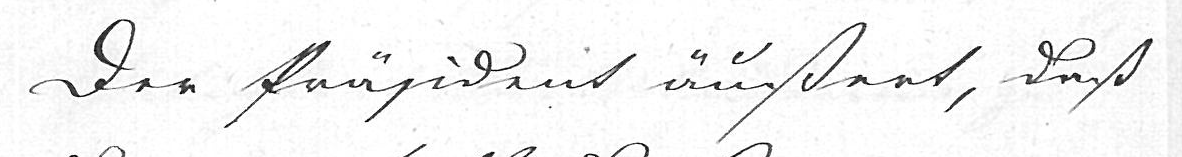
Der Präsident äußert, daß
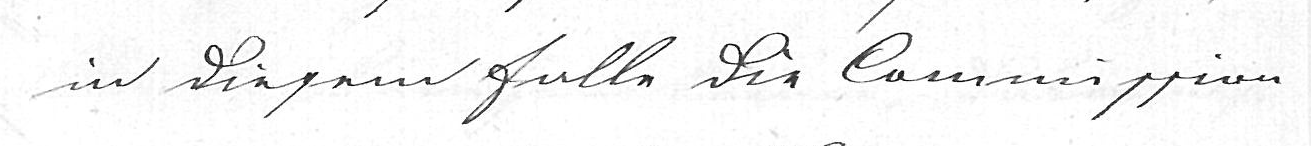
in diesem Falle die Commission
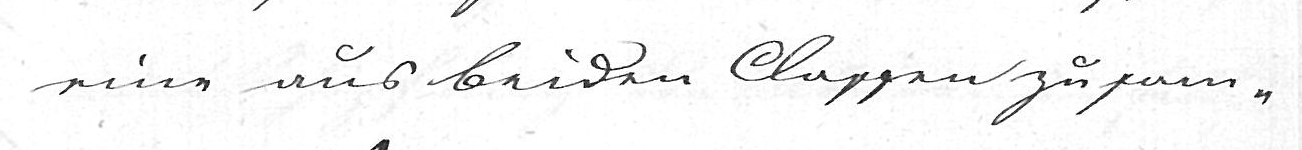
eine aus beiden Classen zusam-
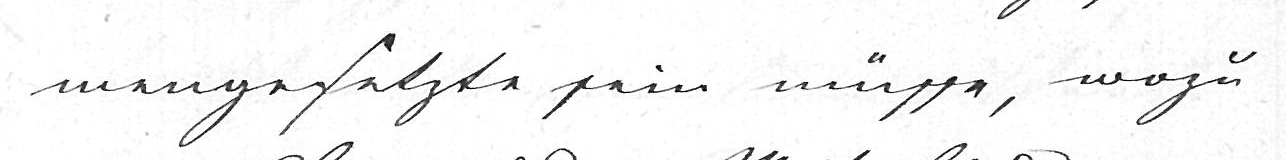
mengesetzte sein müsse, wozu
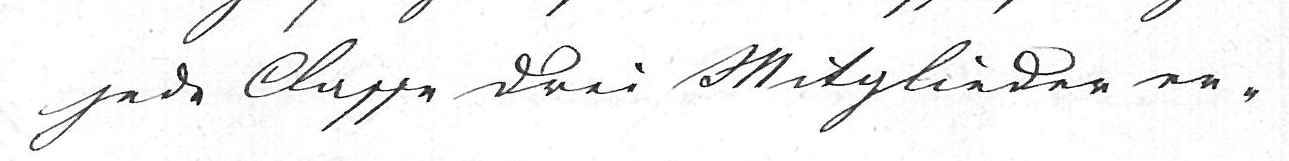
jede Classe drei Mitglieder er-
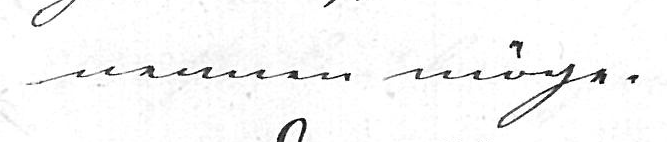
nennen möge.
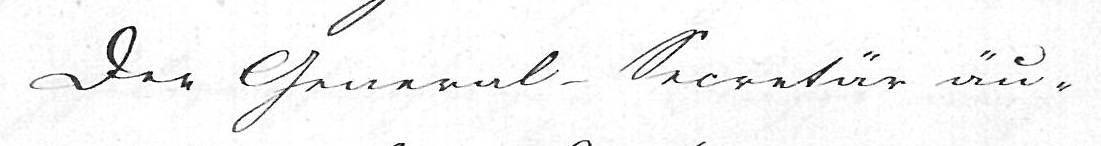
Der General-Secretär äu-
